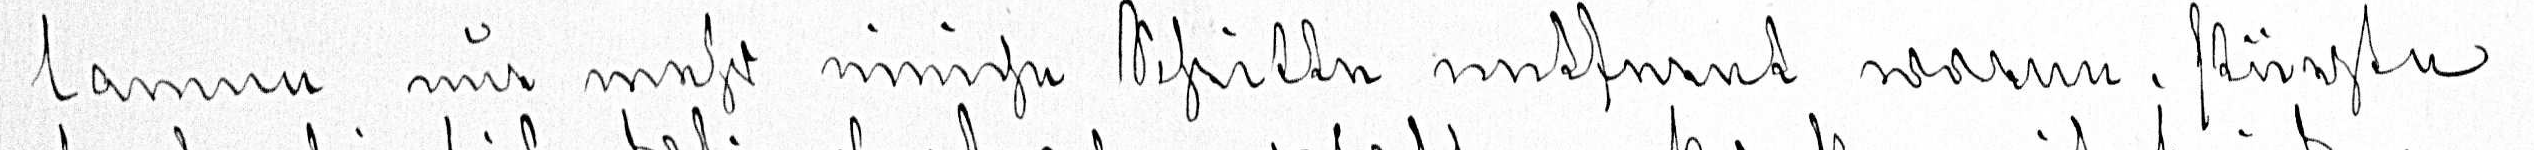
lamun nur mehr einige Schritte entfernt waren, stürzte
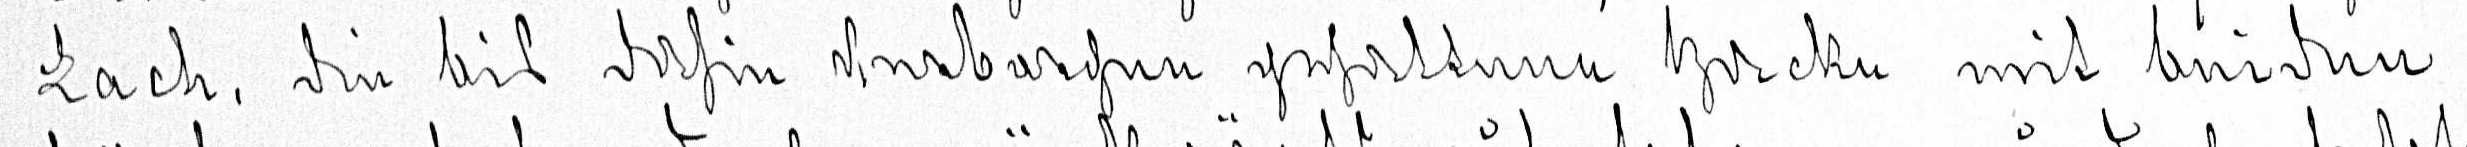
Lach, die bis dahin verborgen gehaltene Hacke mit beiden
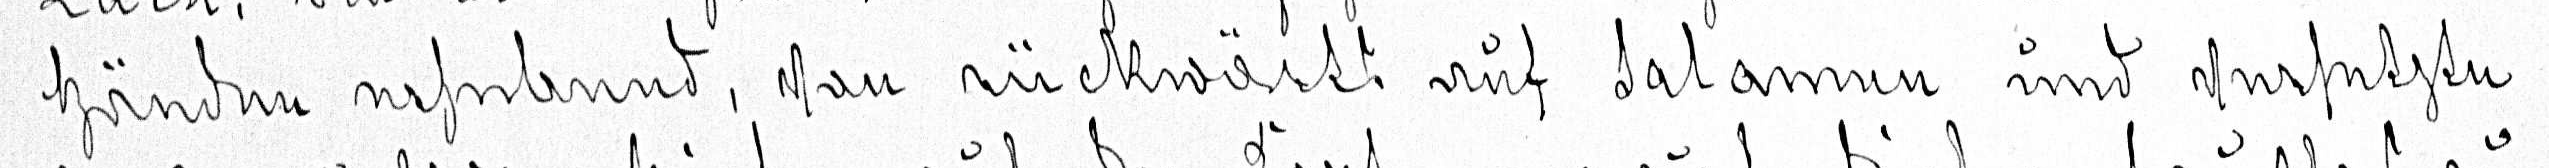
Händen erhebend, von rückwärts auf Salamun und versetzte
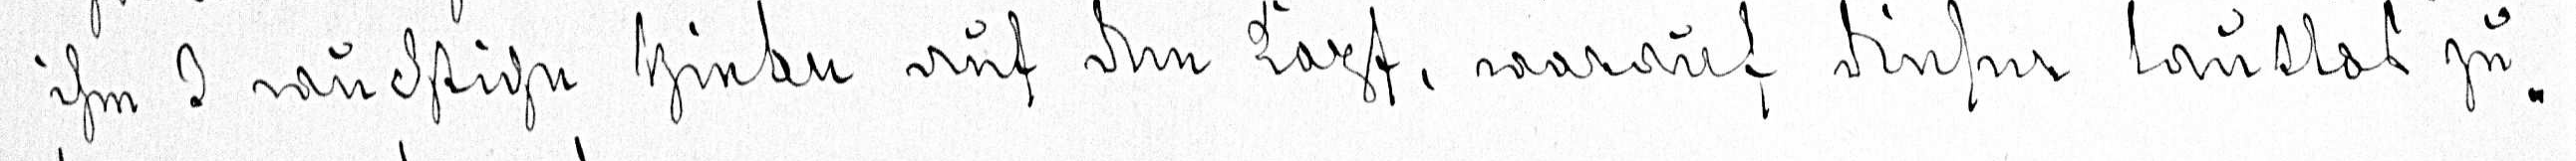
ihm 3 wuchtige Hiebe auf den Kopf, worauf dieser lautlos zu¬
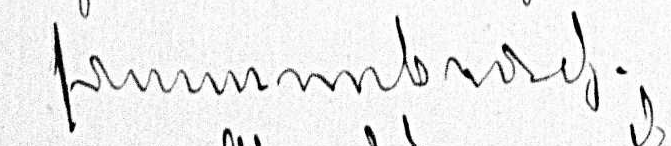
sammenbrach.
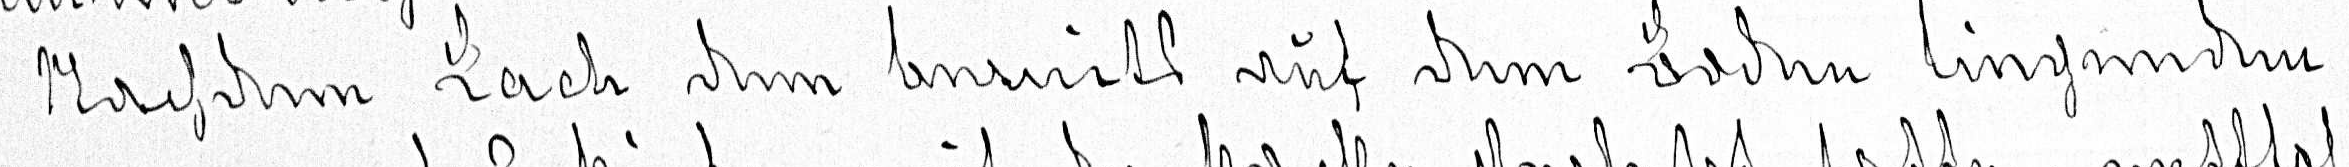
Nachdem Lach dem bereits auf dem Boden liegenden
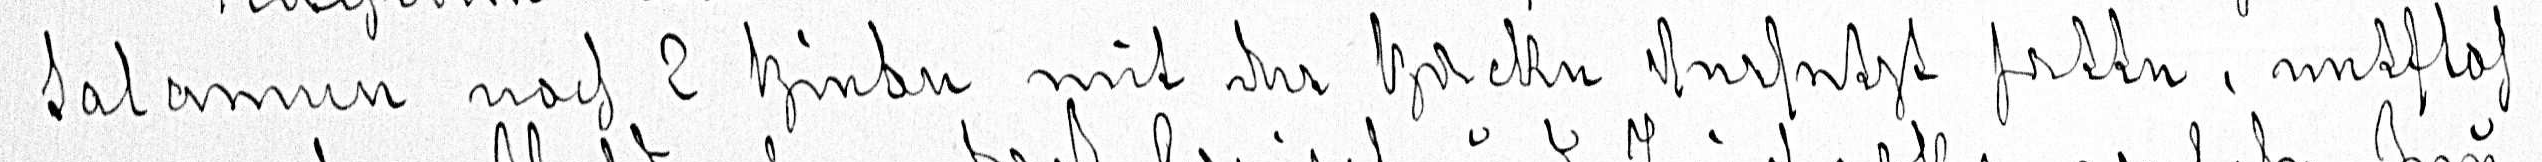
Salamun noch 2 Hiebe mit der Hacke versetzt hatte, entfloh
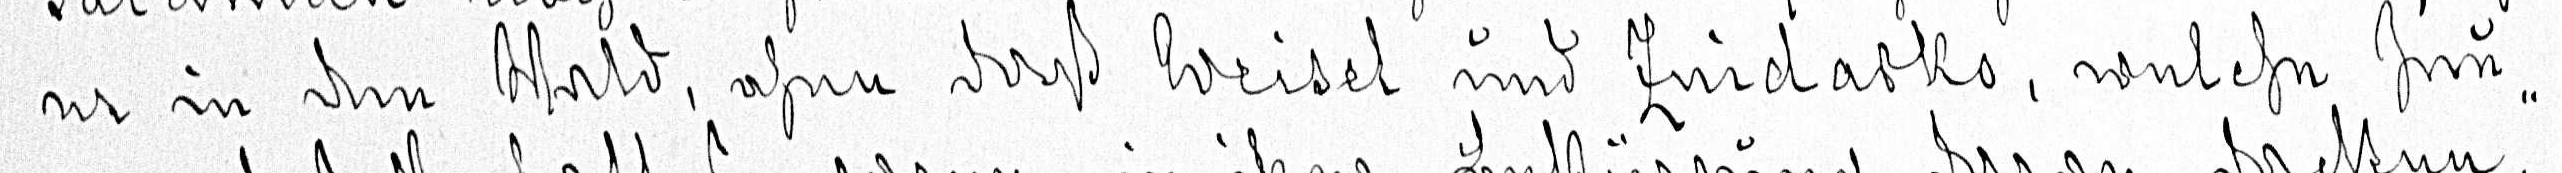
er in den Wald, ohne daß Weisel und Znidarko, welche Zeu¬
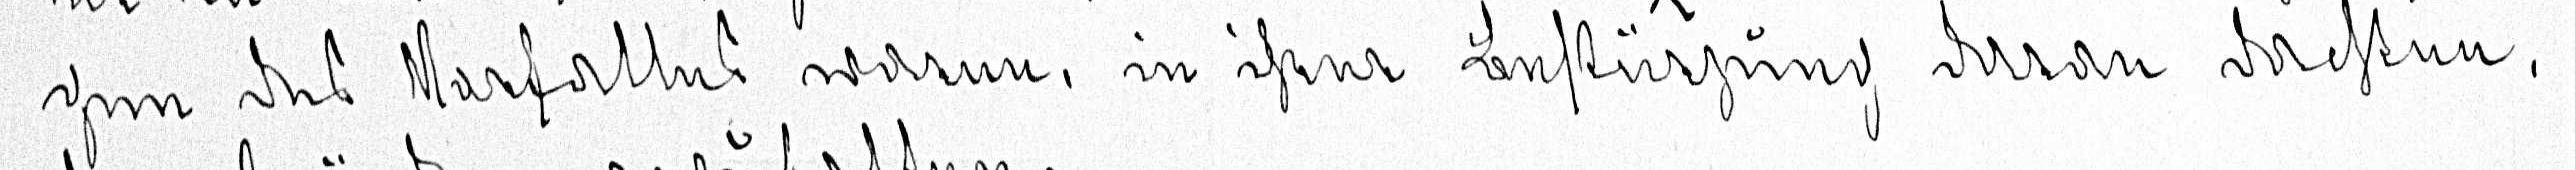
gen des Vorfalles waren, in ihrer Bestürzung daran dachten,
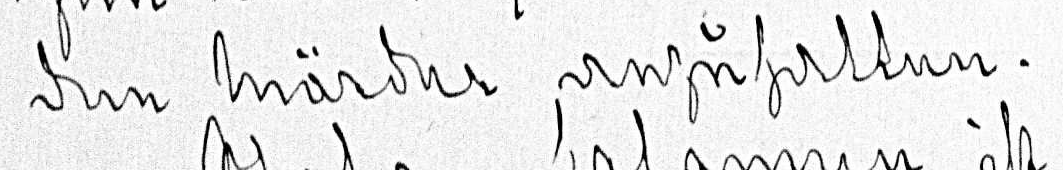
den Mörder anzuhalten.
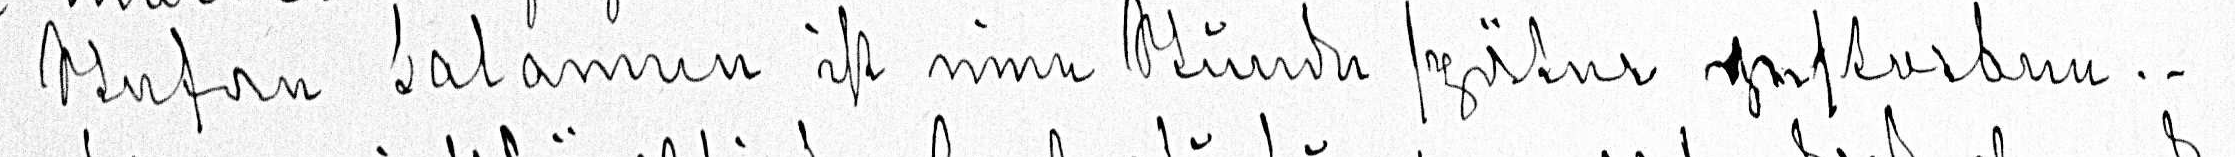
Stefan Salamun ist eine Stunde später gestorben.
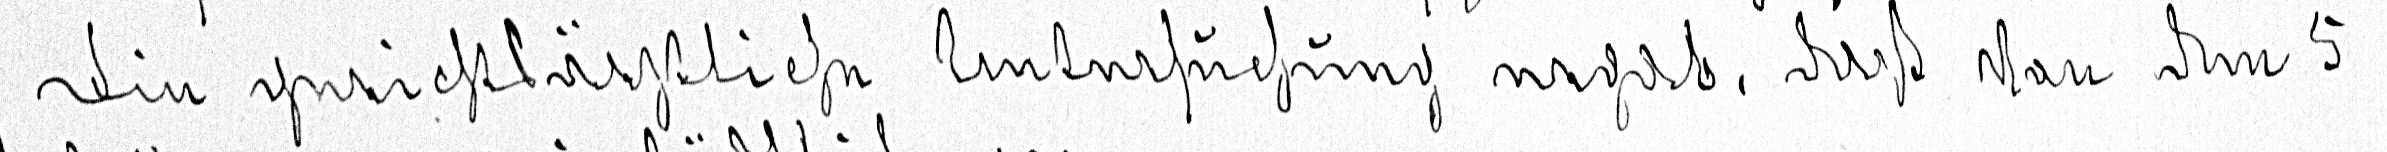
Die gerichtsärztliche Untersuchung ergab, daß von dem 5
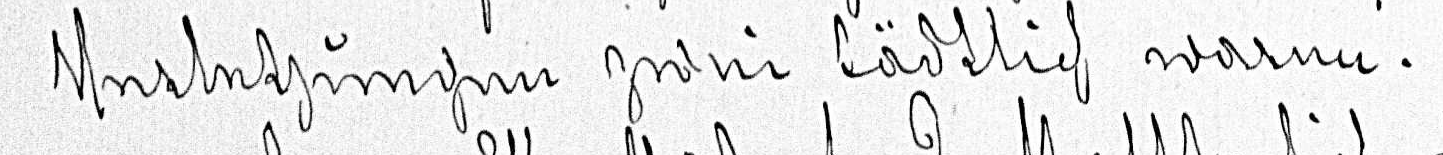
Verletzungen zwei tödtlich waren.
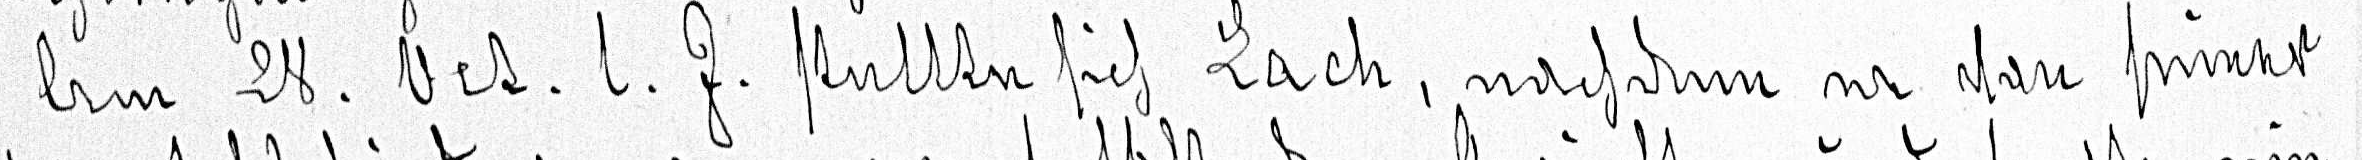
Am. 28. Oct. l. J. stellte sich Lach, nachdem er von seiner
